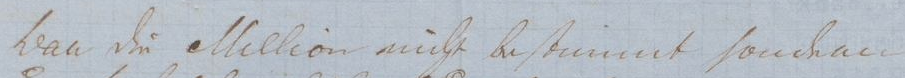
war die Million nicht bestimmt, sondern
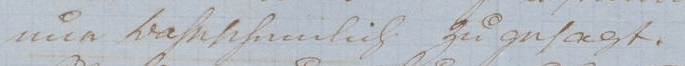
nur wahrscheinlich zugesagt.
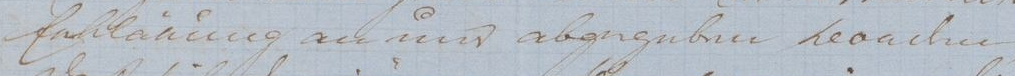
Erklärung an uns abgegeben worden,
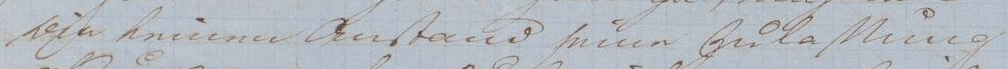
wir keinen Anstand seine Zulassung
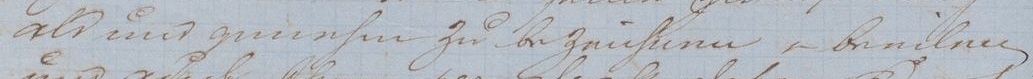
als uns genehm zu bezeichnen & beeilen
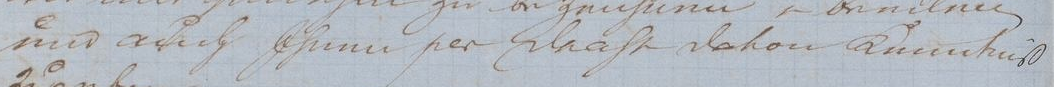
uns auch Ihnen per Draht davon Kenntniß
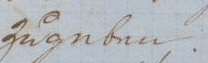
zu geben.
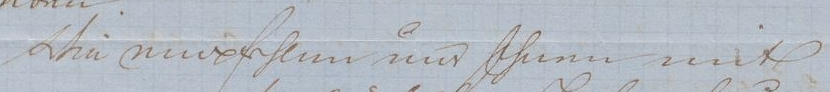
Wir empfehlen uns Ihnen mit
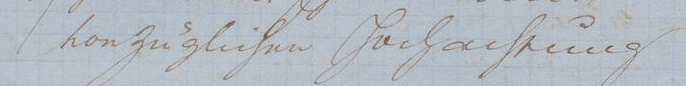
vorzüglicher Hochachtung
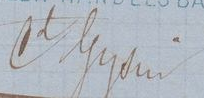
Cd Gysin
